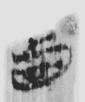畜
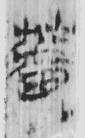蕃
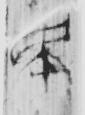民
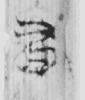有
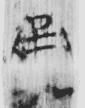甬
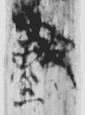{堇攴}
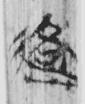{辶各}
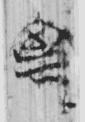室
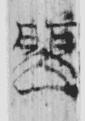{聑立}
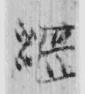洍
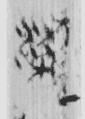梁
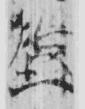{攸土}
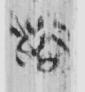浴
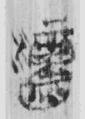{水辛𠂤臼}
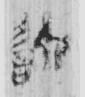{幺言斤}
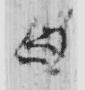舟
